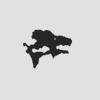百
